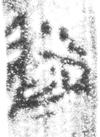○（繸）
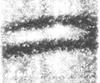二
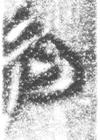紡
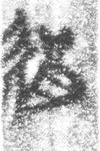絹
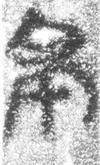帛
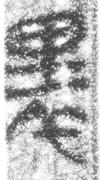裏
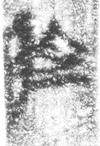組
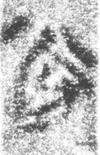○（繸）
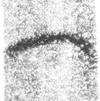一
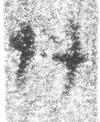友
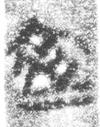齊
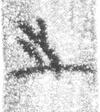之
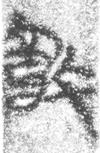○（袷）
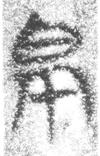帛
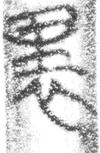裏
